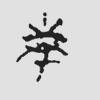庚
